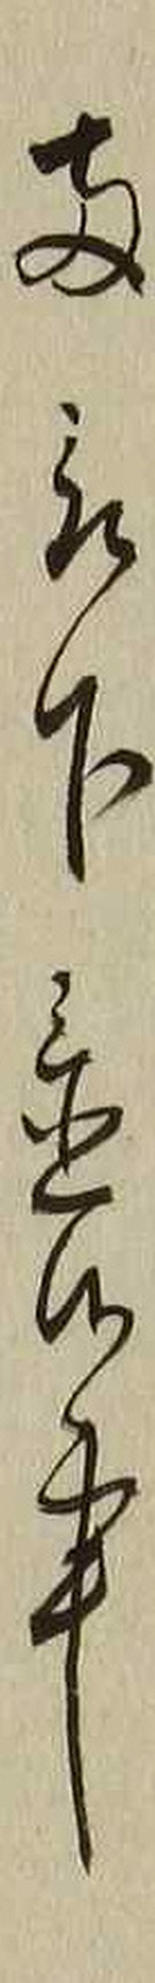両被下置候事
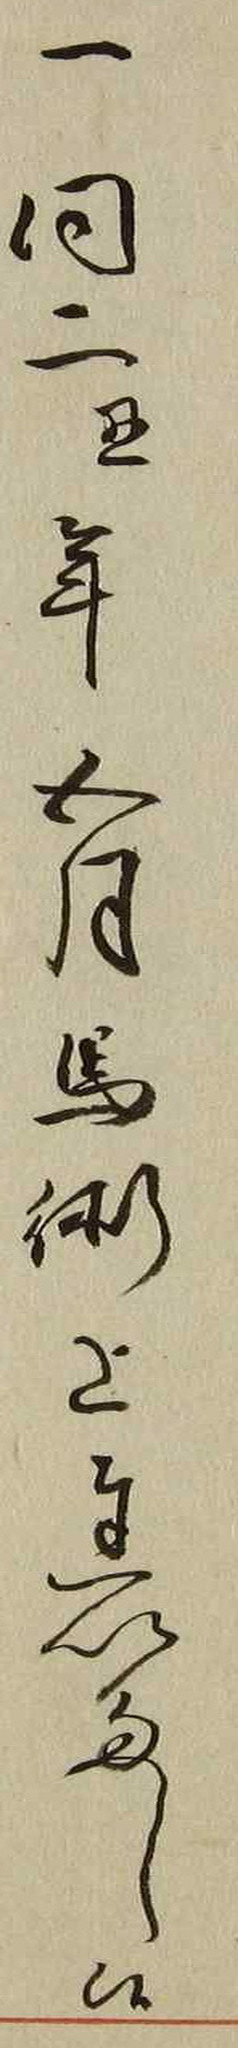一同二丑年五月馬術上達いたし候
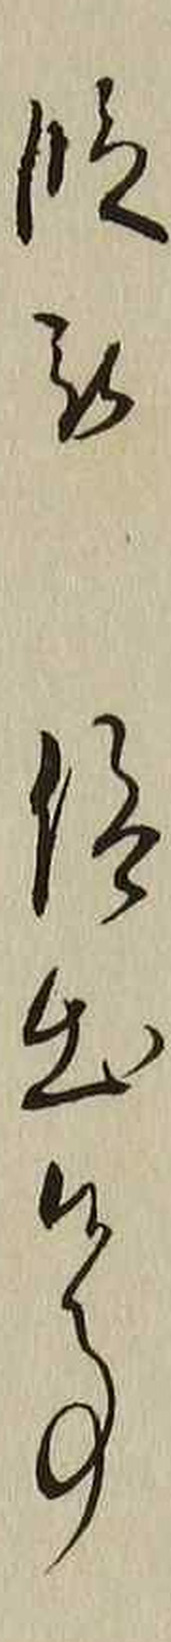段被仰出候事
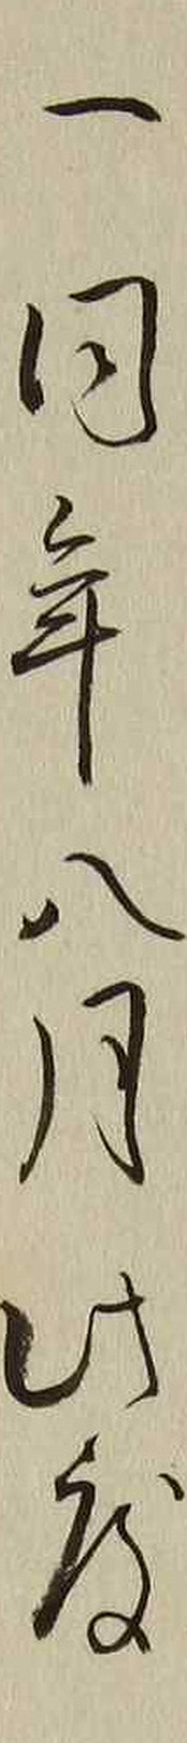一同年八月此度
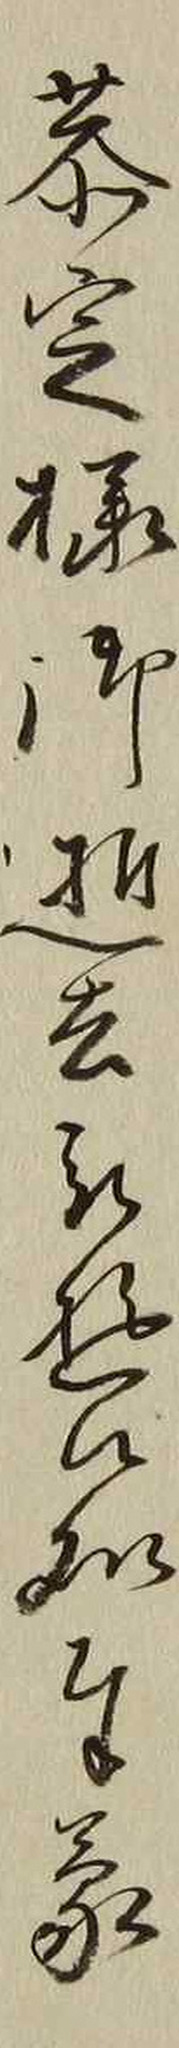恭定様御逝去被遊候処奉蒙
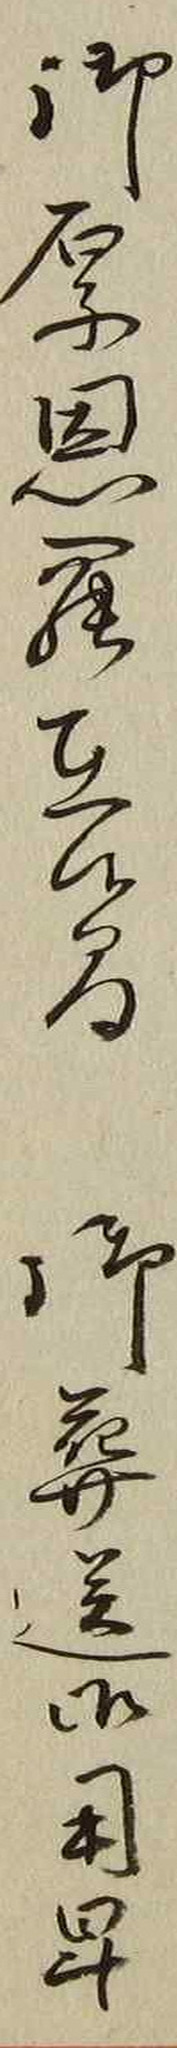御厚恩罷在候間御葬送御用卑
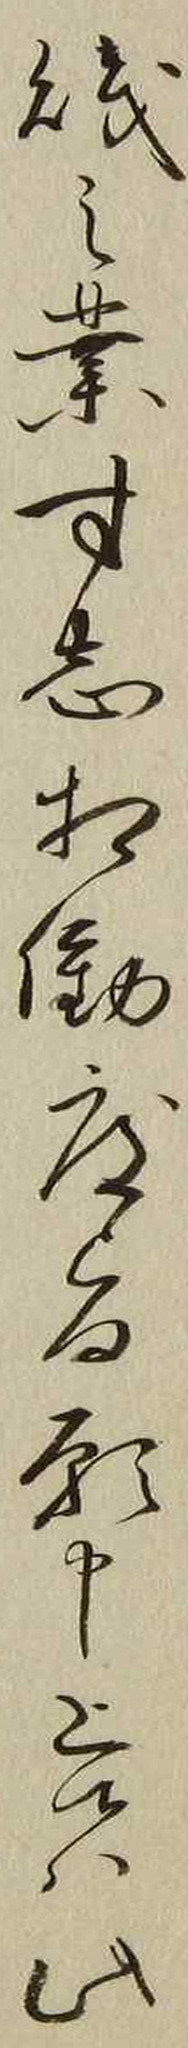賎之業寸志相働度旨願申上候は此
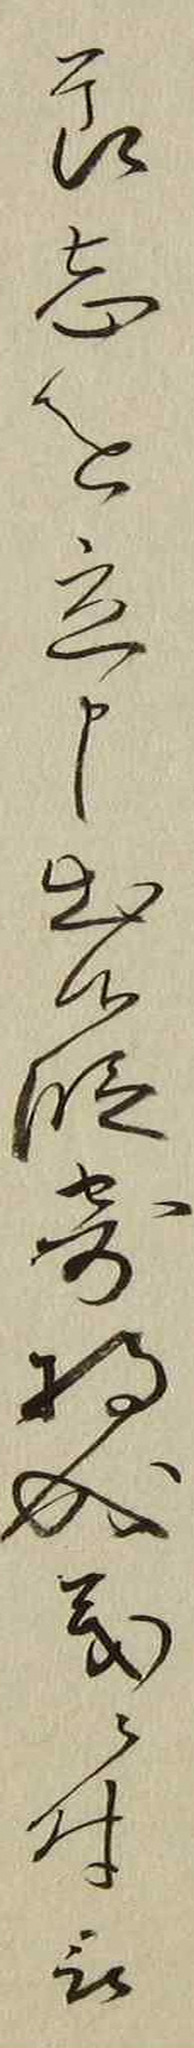節志を立申出候段奇特成義に付被
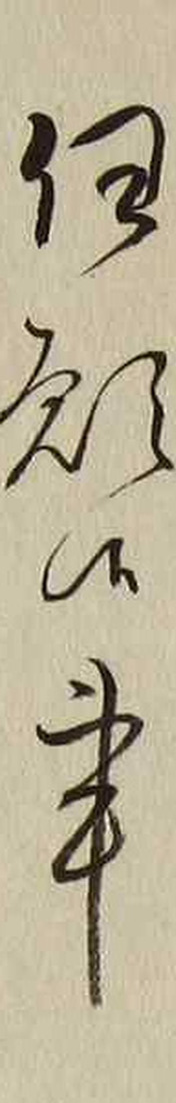任願候事
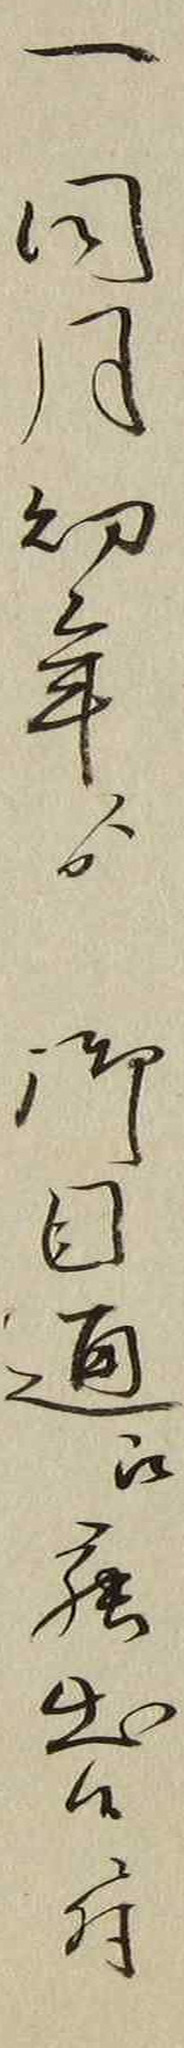一同月幼年ゟお目通江罷出候に付
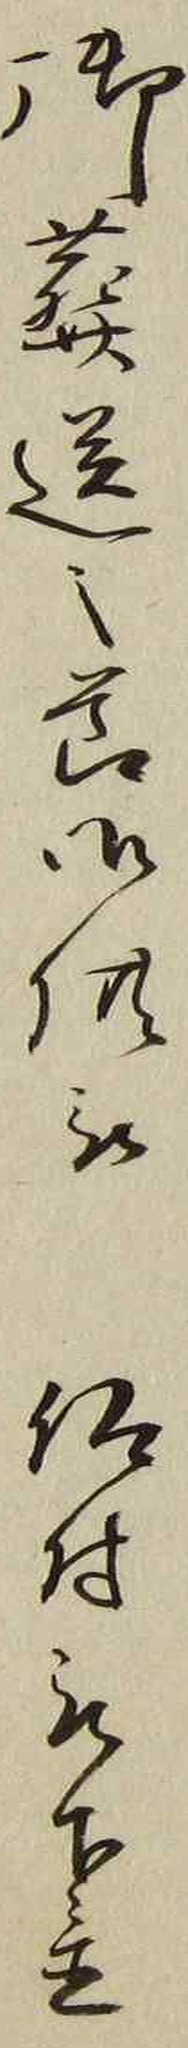御葬送之節御供被仰付被下置
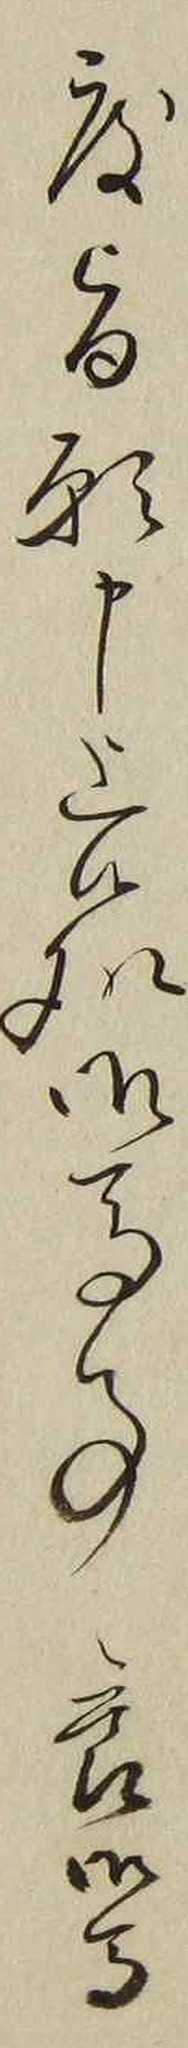度旨願申上候処御馬事之節御馬

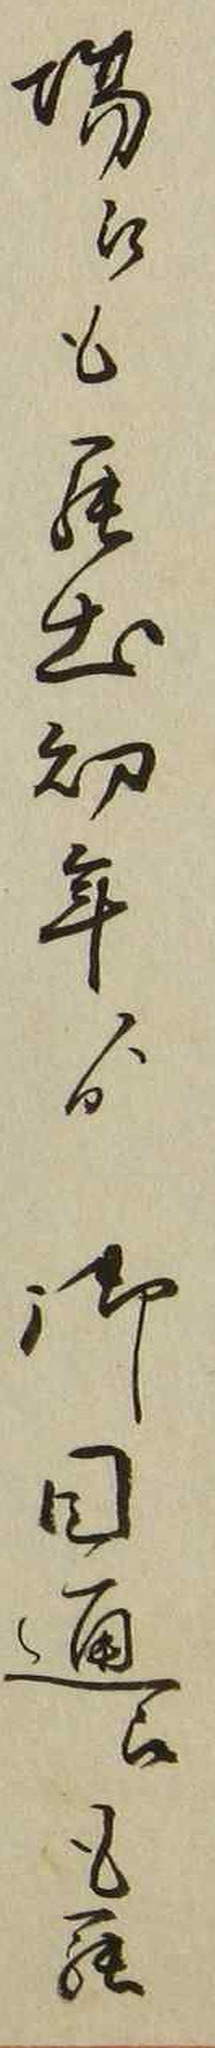場江も罷出幼年ゟ御目通江も罷
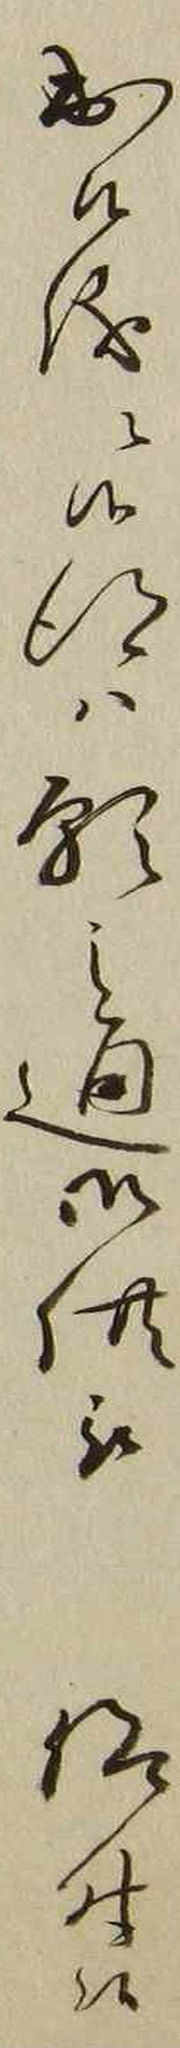出候儀に候得は願之通御供被仰付候
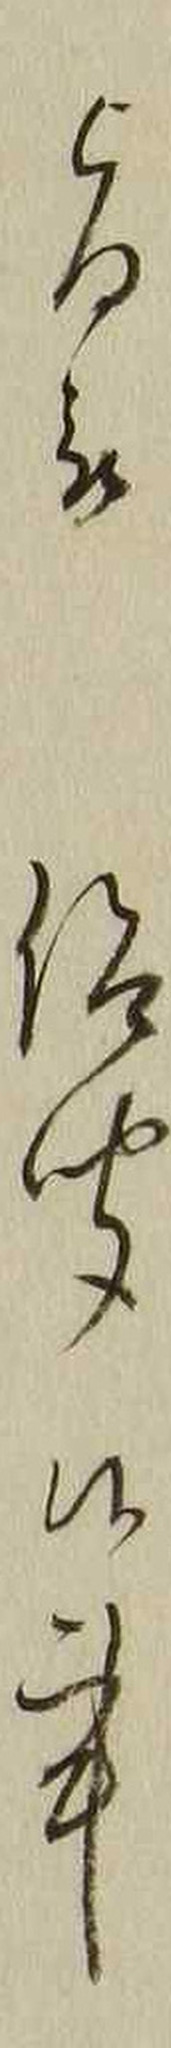旨被仰聞候事
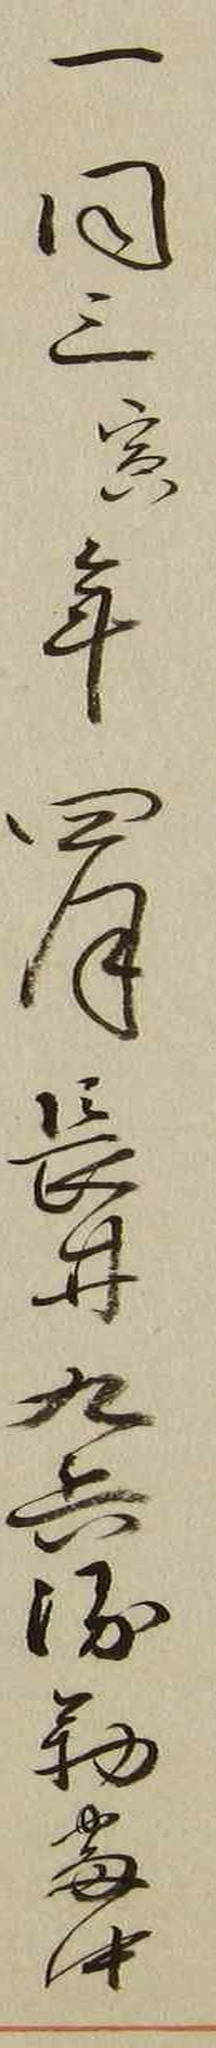一同三寅年四月長井久兵衛勤番中
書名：諸士系譜　巻之3　い之部3
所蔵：会津若松市立会津図書館
